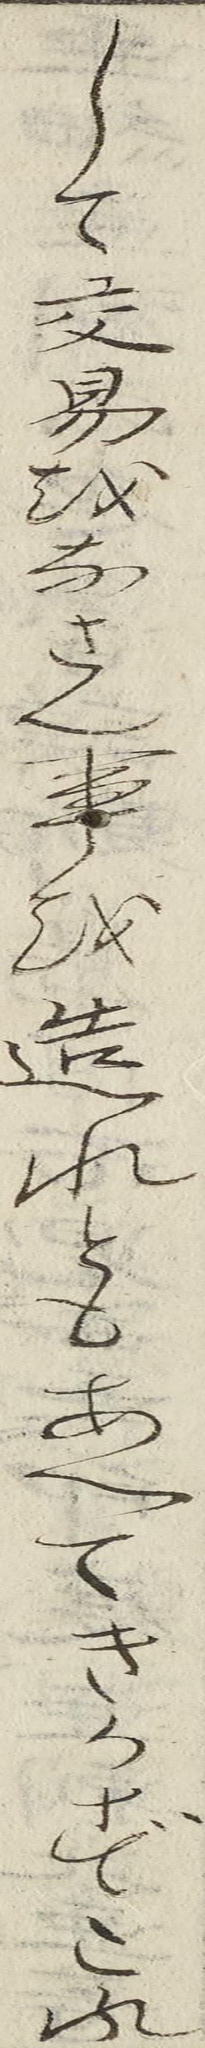して交易なさん事を造れともあへてきかずこれ
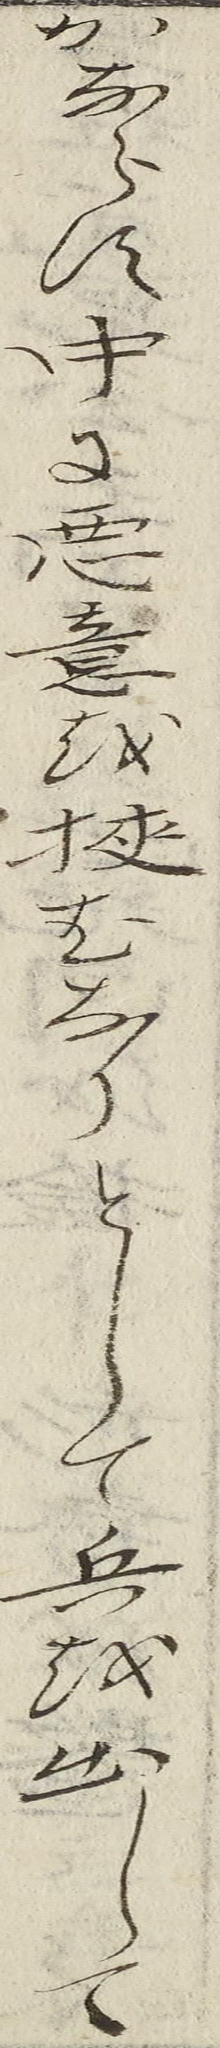かならす中に悪意を挟むなりとして兵を出して
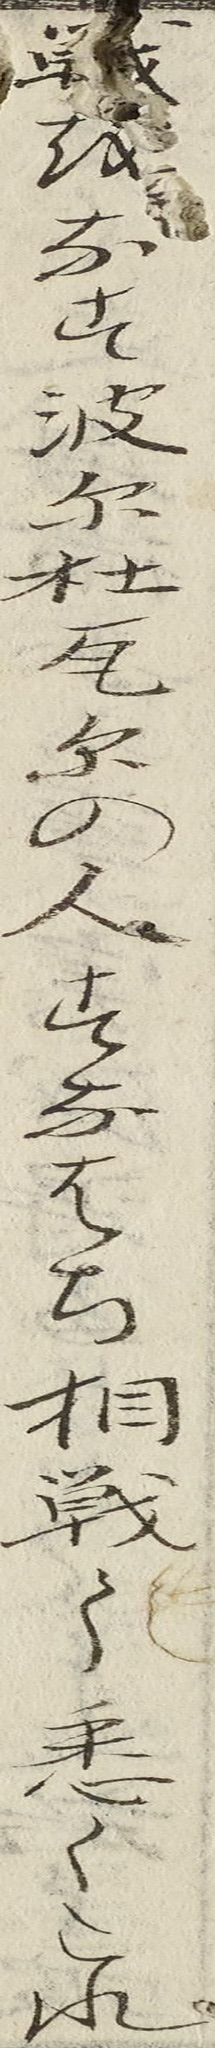戦をなす波尓杜亙尓の人すなはち相戦て悉くこれ
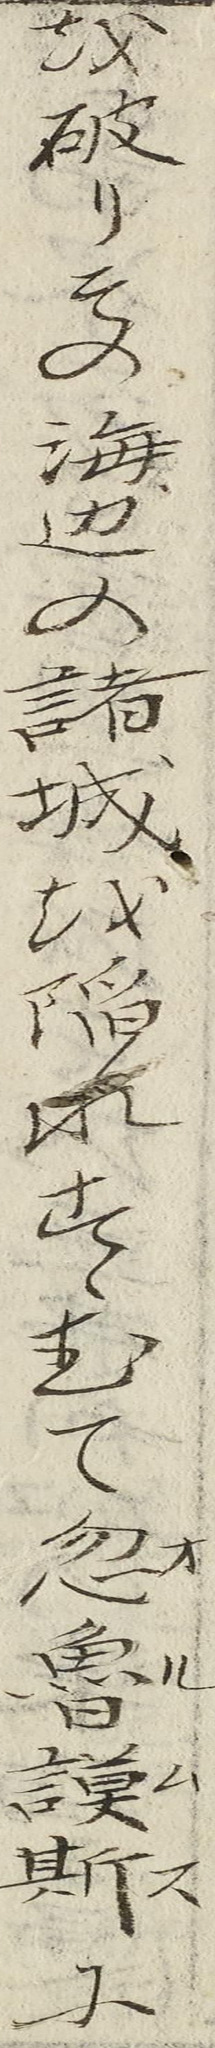を破りその海辺の諸城を陥れすゝむて忽魯謨斯に
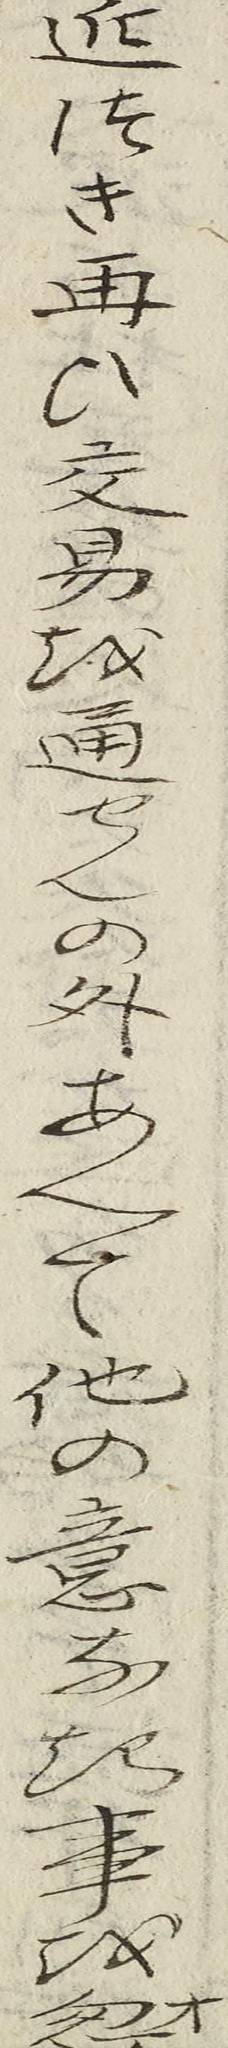近つき再ひ交易を通せんの外あへて他の意なき事を忽
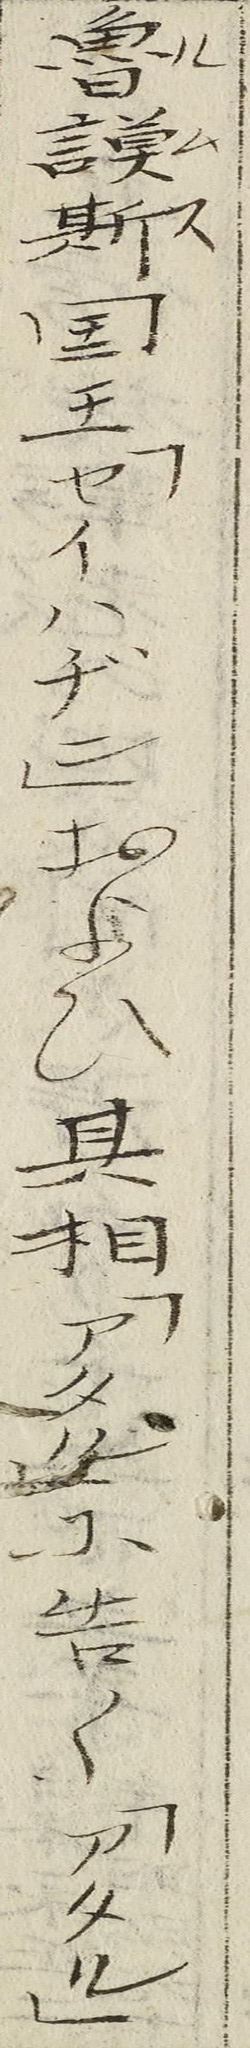魯謨斯国王「セイハヂン」およひ其相「アタル」に告く「アタル」
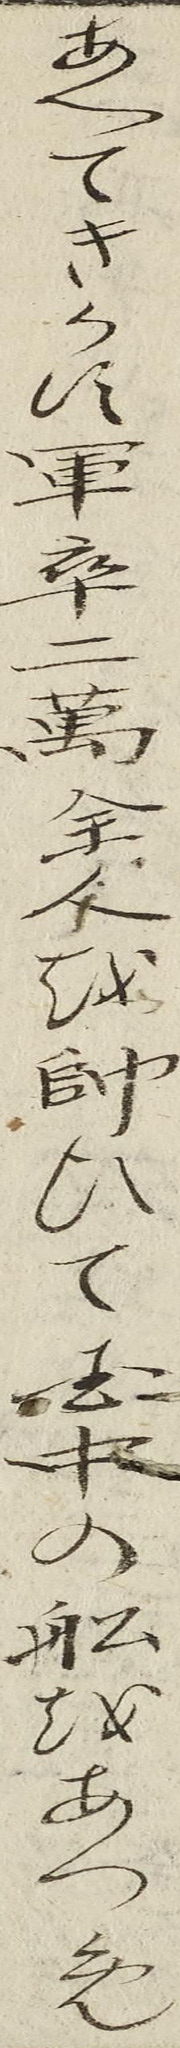あへてきかす軍卒二万余人を師ひて国中の船をあつめ
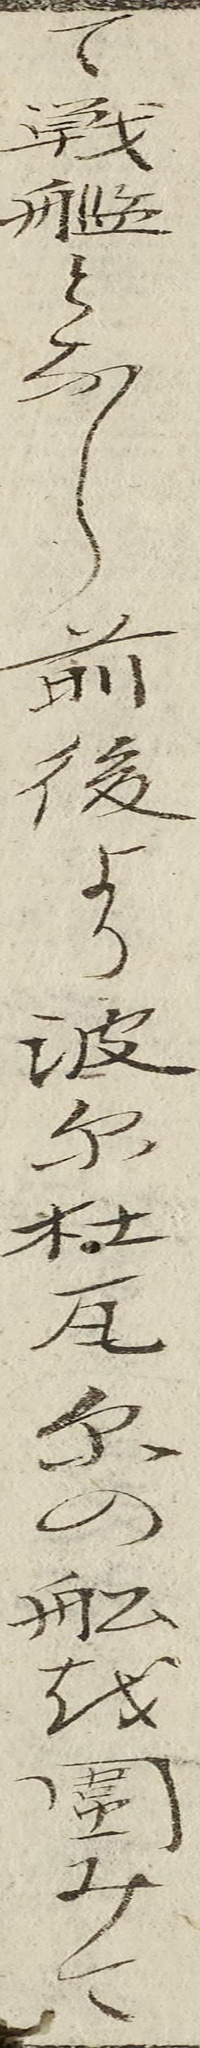て戦艦となし前後より波尓杜亙尓の船を囲みて
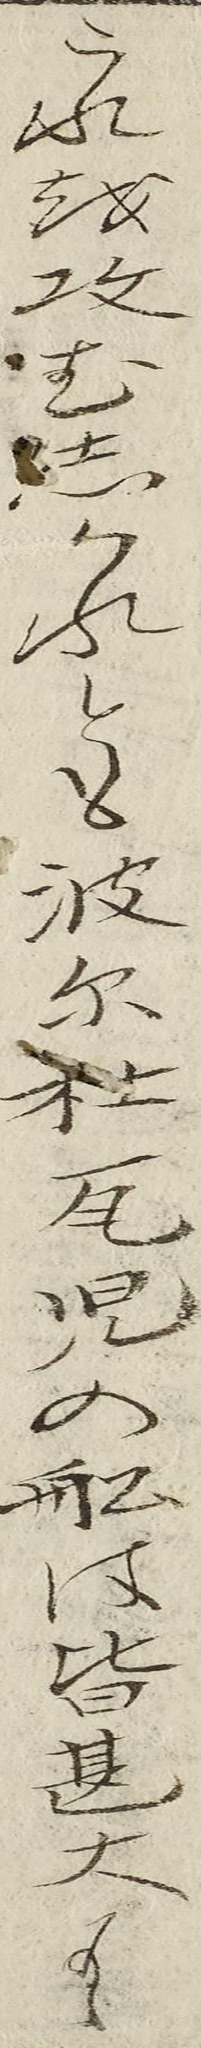これを攻むしかれとも波尓杜亙児の船は皆甚大に
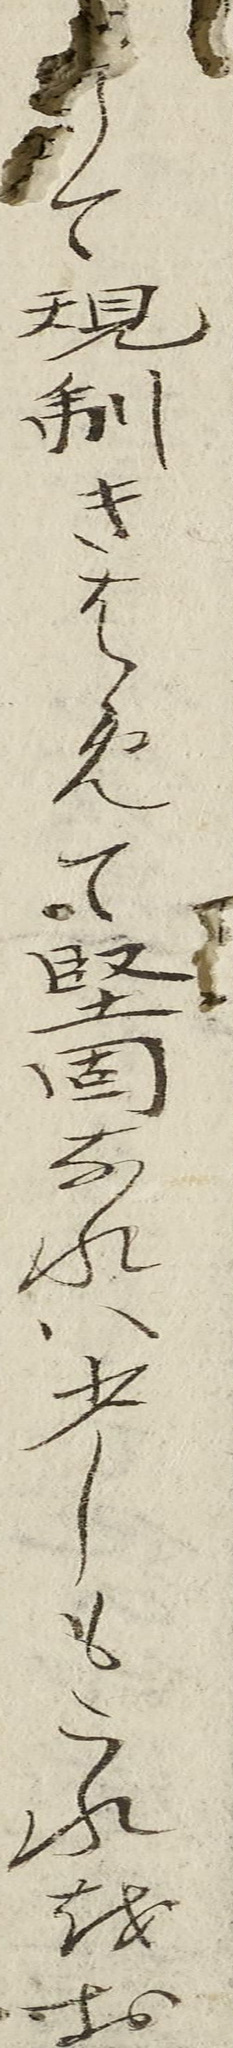して規制きはめて堅固なれハ少しもこれをお
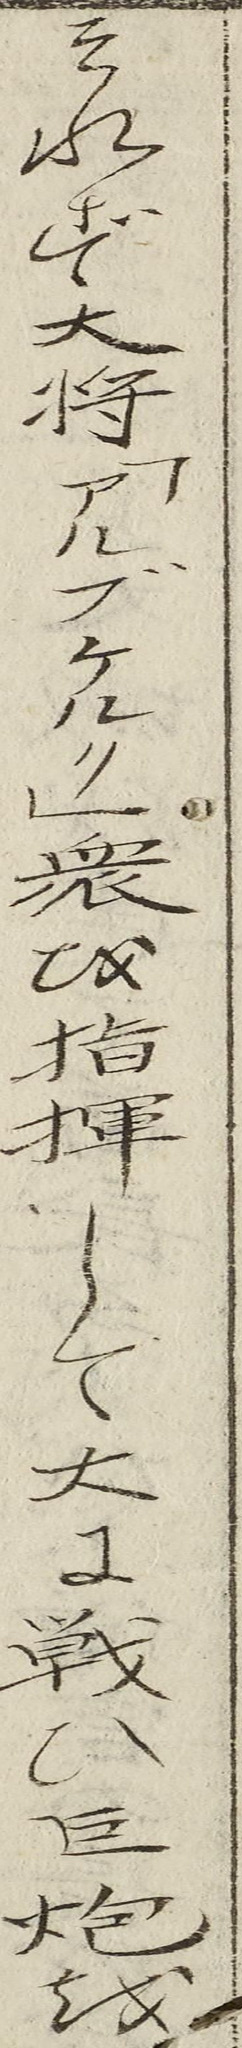それず大将「アルブケルク」衆を指揮して大に戦ひ巨炮を
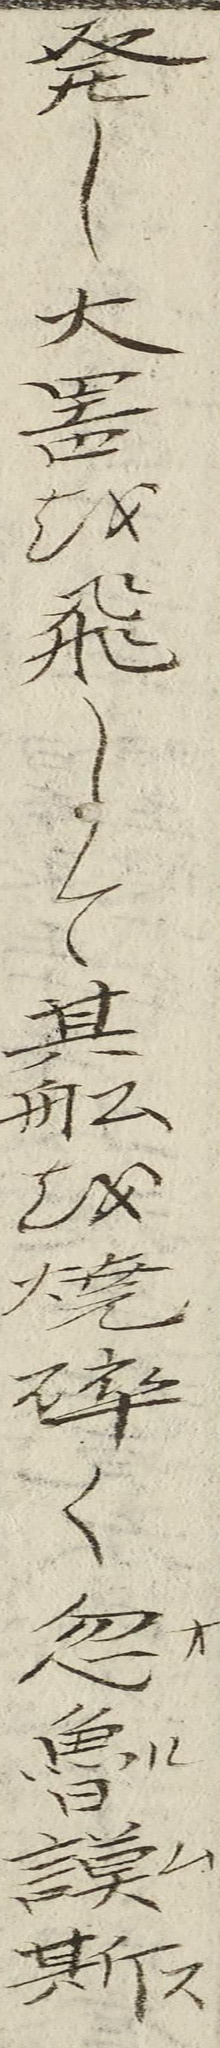発し大器を飛して其船を焼碎く忽魯謨斯
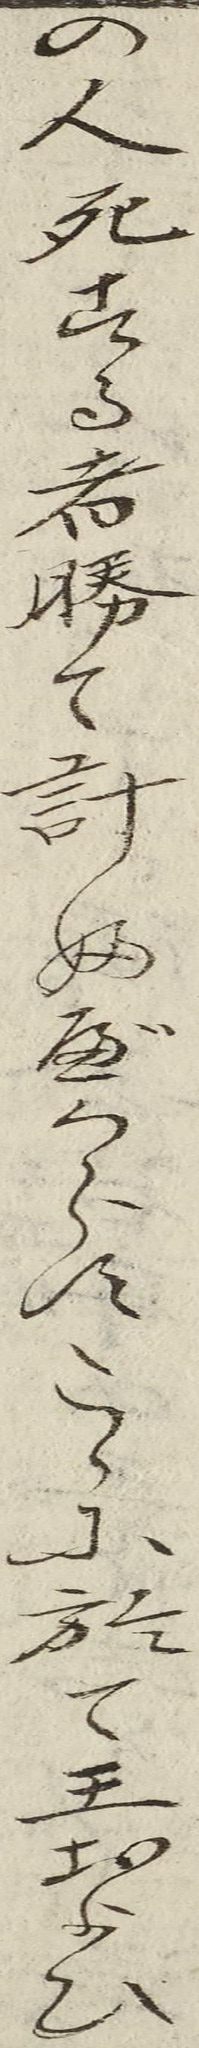の人死する者勝て計ふべからすこゝに於て王およひ
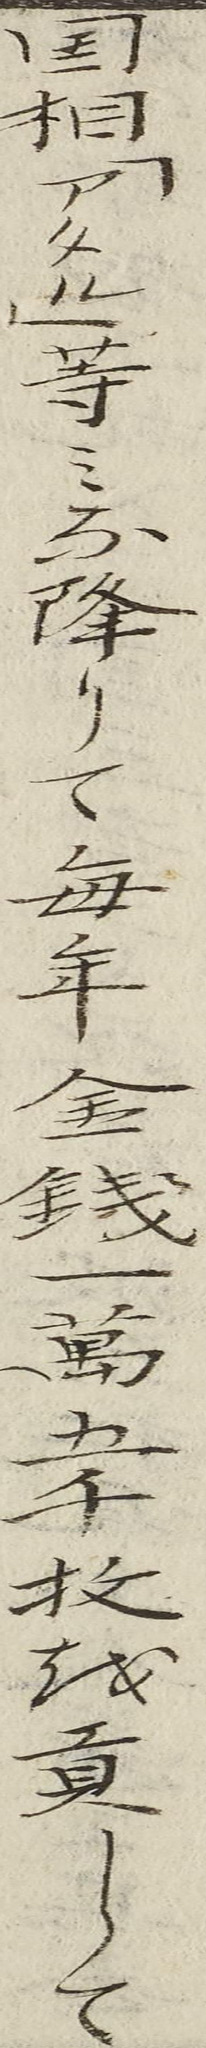国相「アタル」等ミな降りて毎年金銭一万五千枚貢して
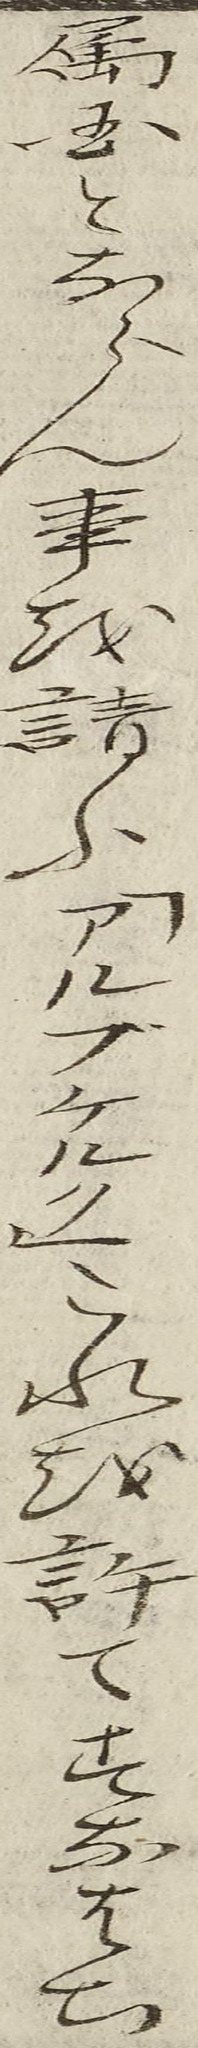属国ｔならん事を請ふ「アルブケルク」これを許てすなはち
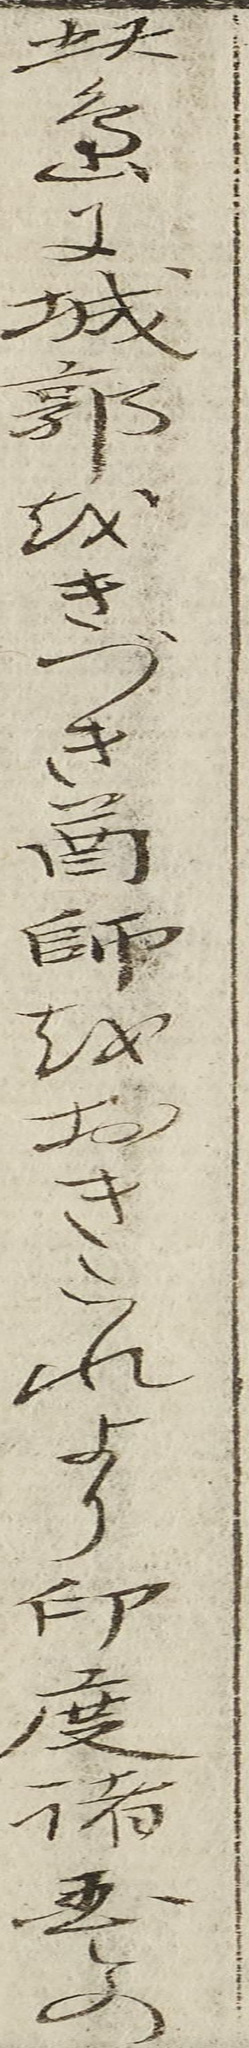此島に城郭をきづき酋師をおきこれよりインド諸国との
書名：西洋雜記　乾
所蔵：東京大学地震研究所図書室 Earthquake Research Institute Library, The University of Tokyo, JAPAN
